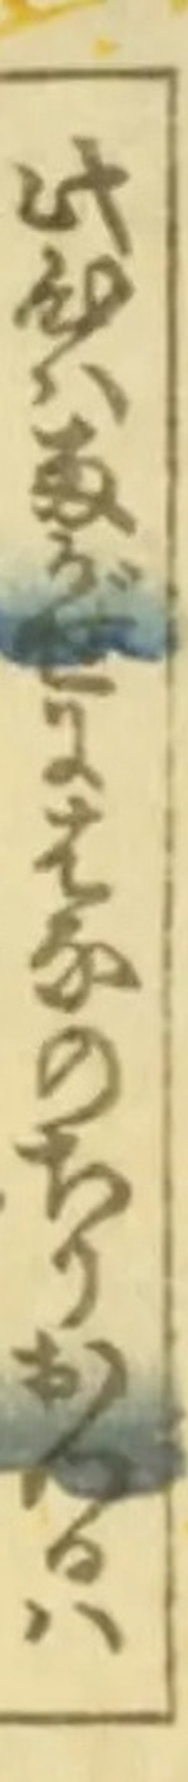此心は雨かぜにはなのちりおつるは
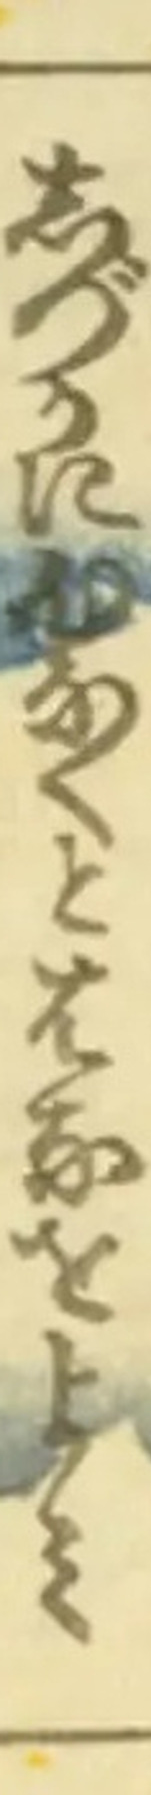しづかに心なくとはなをよみ
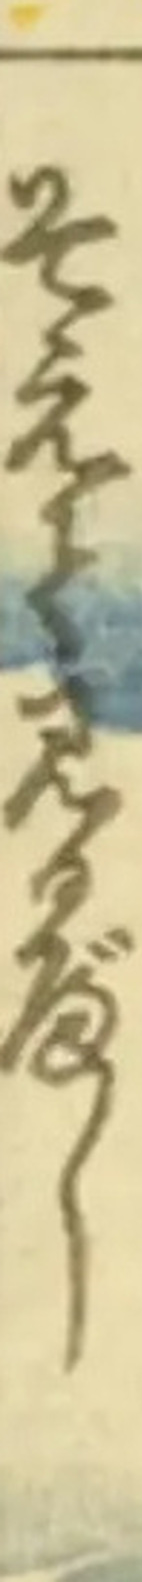そえて見るべし
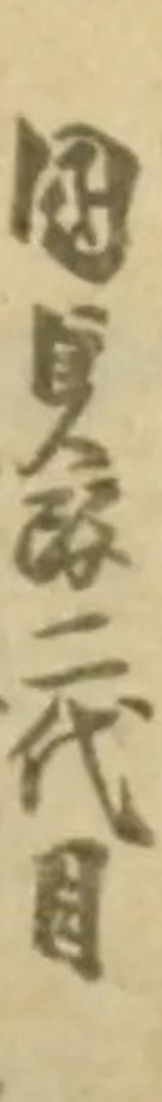国貞改二代目
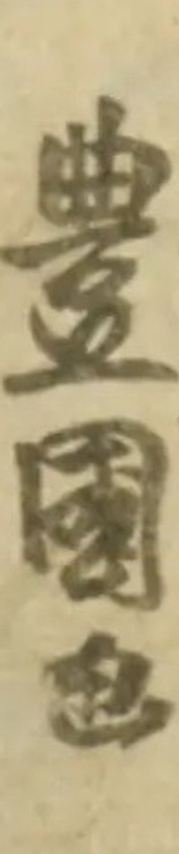豊国画
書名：百人一首絵抄 三十二 紀友則
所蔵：国立国会図書館 National Diet Library, JAPAN
